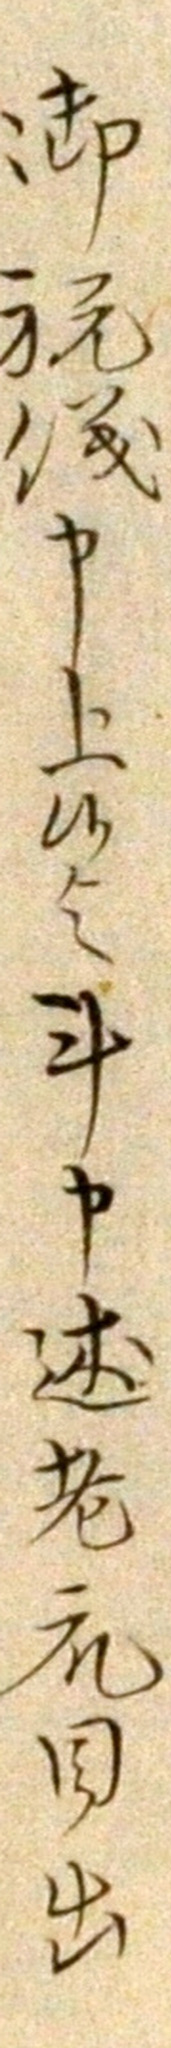御祝儀申上候と計申述老衆目出
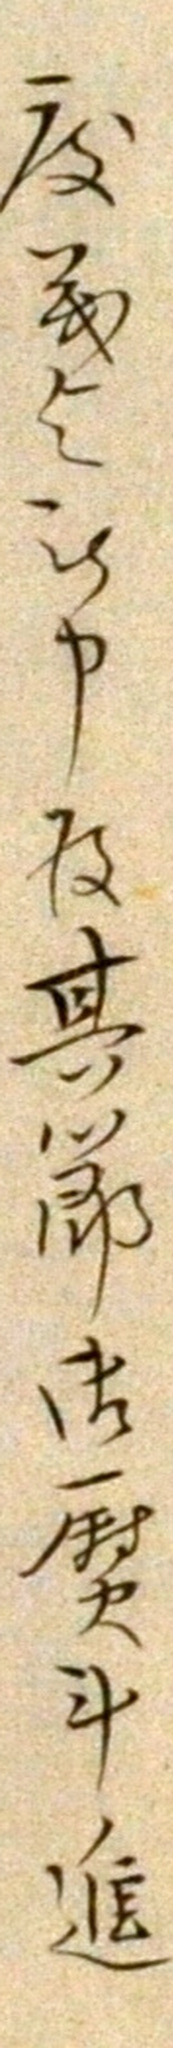度義と被申候其節御熨斗進
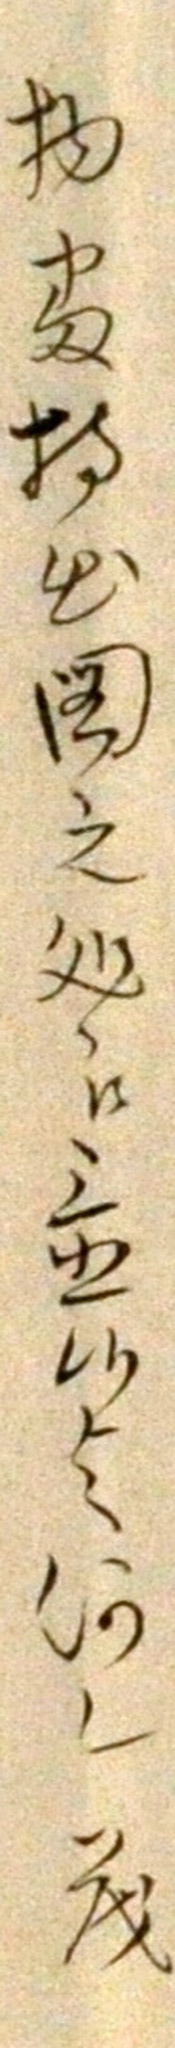物番持出図之処え置候と何レも
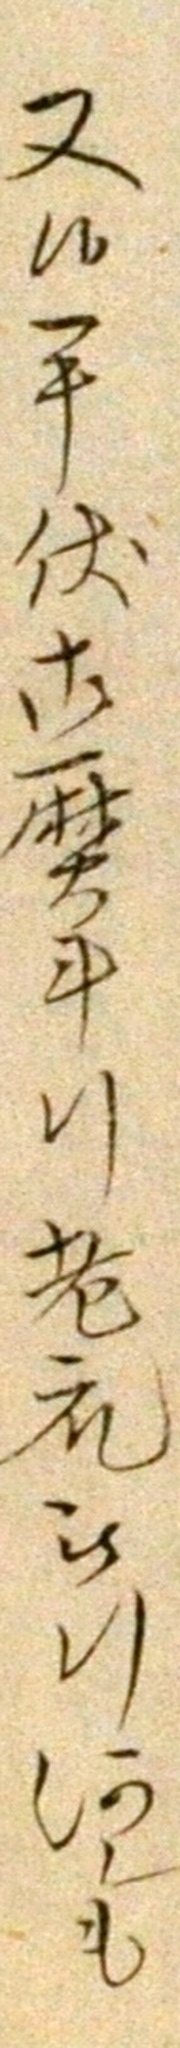又候平伏御熨斗引老衆被引何レも
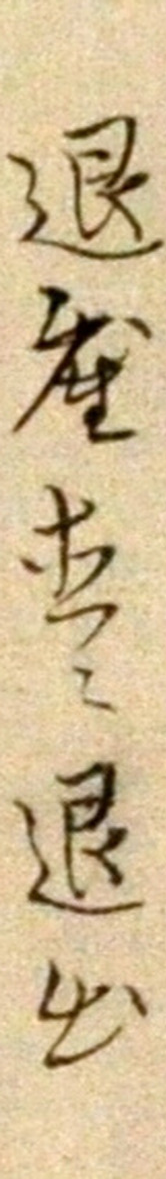退座直ニ退出
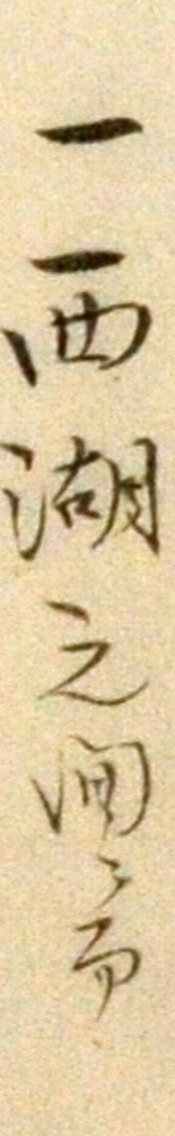一西湖之間ニ而
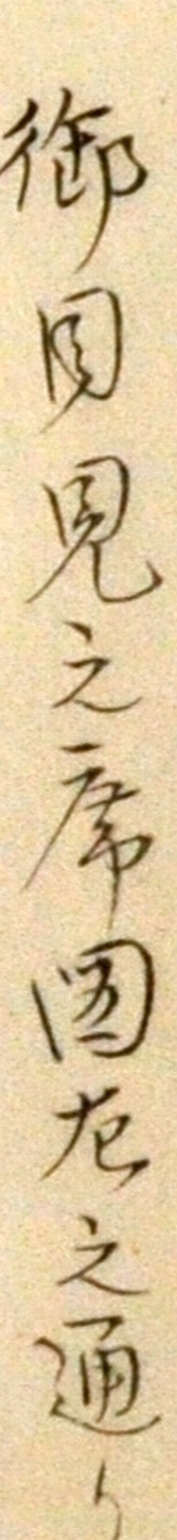御目見之席図左之通り

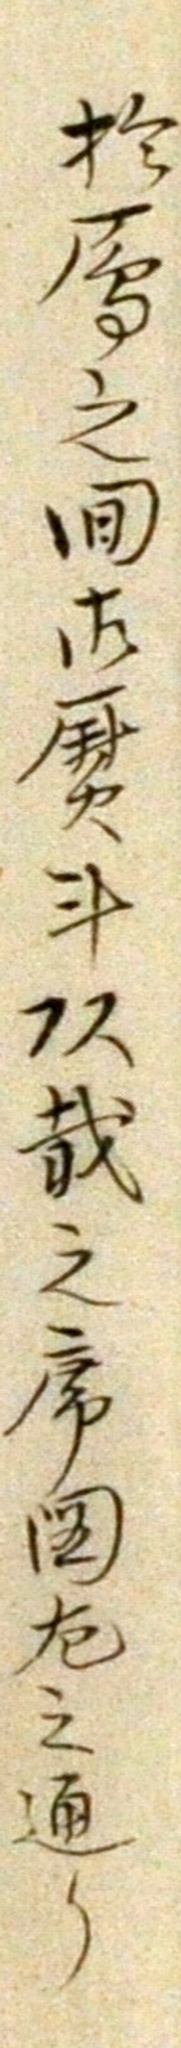於雁之間御熨斗頂戴之席図左之通り

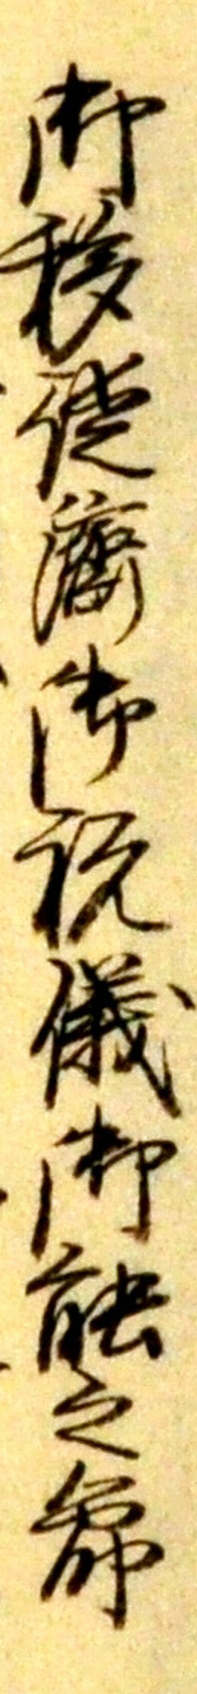御移徙済御祝儀御能之席
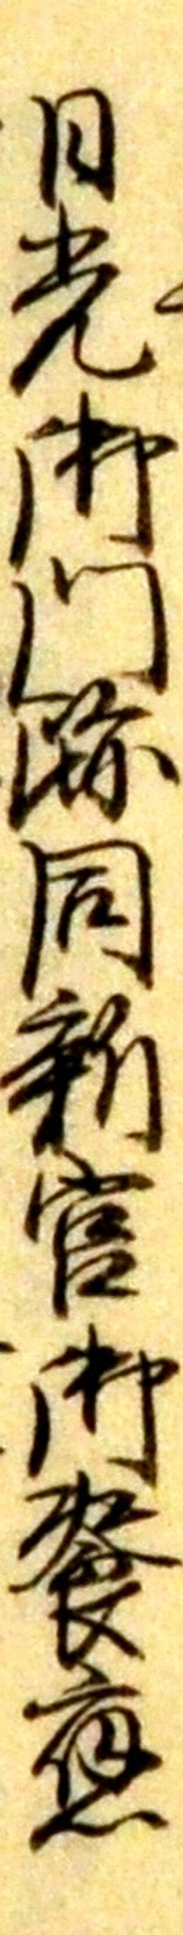日光御門跡同新官御饗応
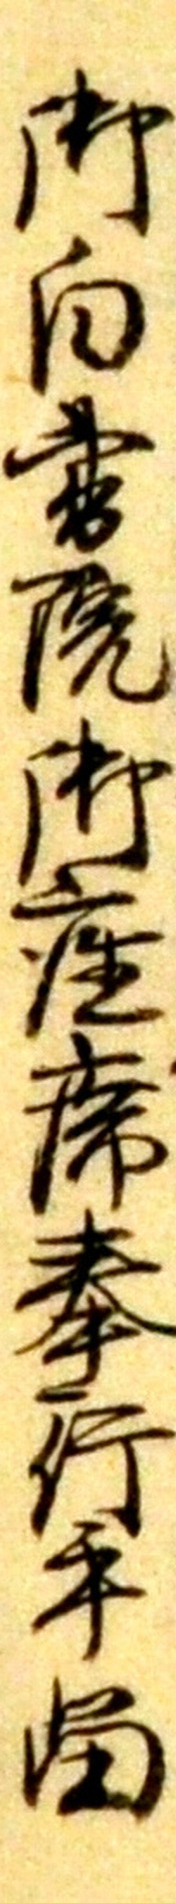御白書院御座席奉行手留

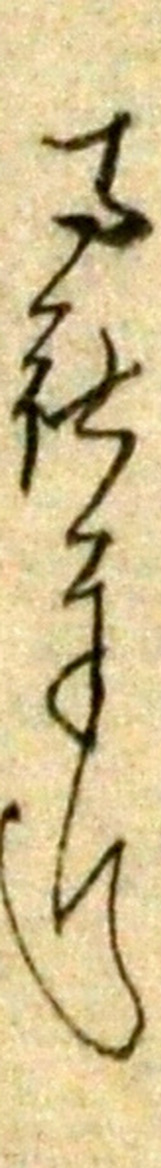寺社奉行
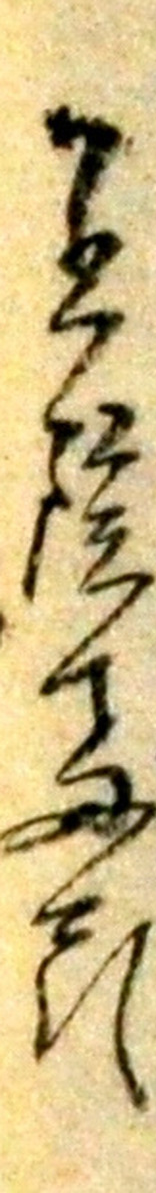御書院番頭
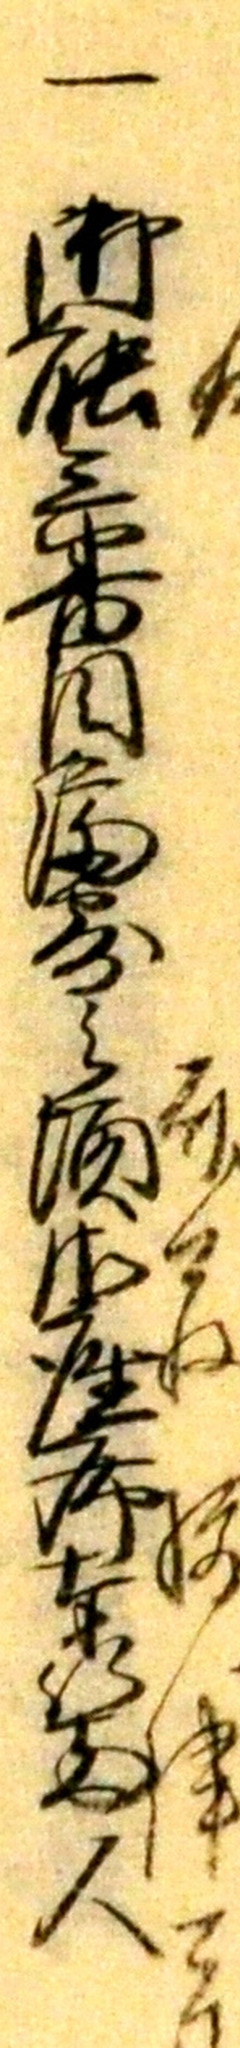一御能三番目済寄之頃御座候奉行両人
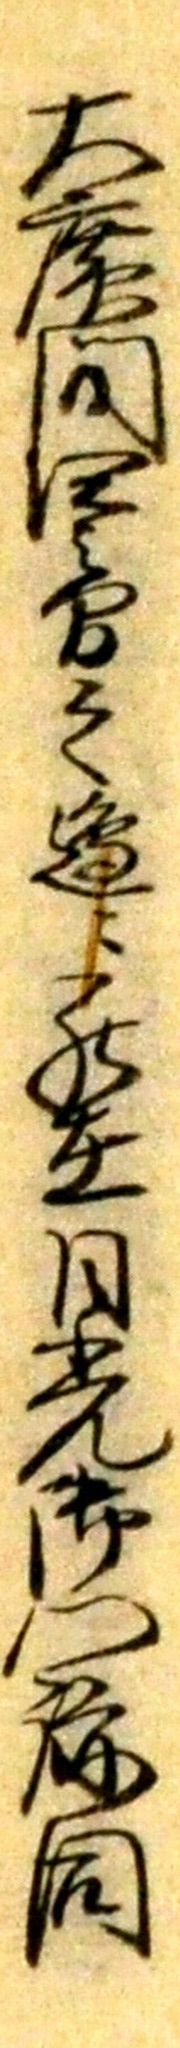大広間四之間之辺ニ罷在日光御門跡同
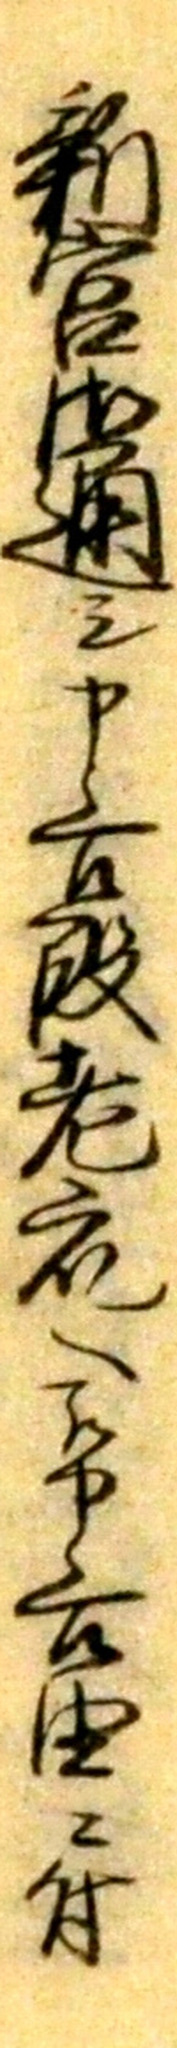新官御通シ申上候段老衆へ被申上候由ニ付
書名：御移徒相済御祝儀御能ノ節ノ留外
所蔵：伊那市立高遠町図書館・合同会社AMANE
